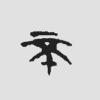不
